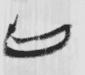㠯（以）
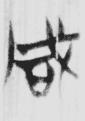咸
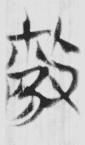{尒白水攴}
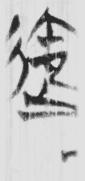御
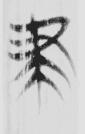聿
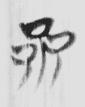參
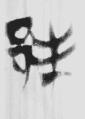邦
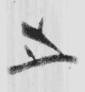之
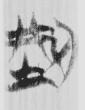型
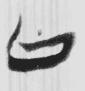㠯（以）
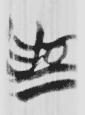爲
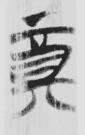奠
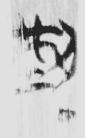型
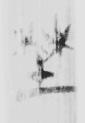埜
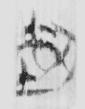型
